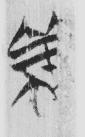{羊䖵}
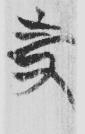寺
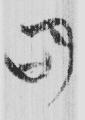名
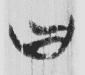曰
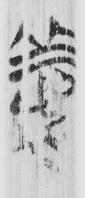恙
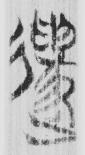{辶𦥔豕}
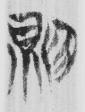則
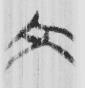文
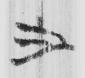之
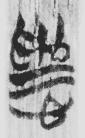{爲心}
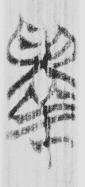鬲
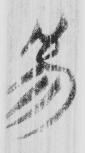象
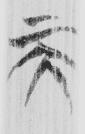天
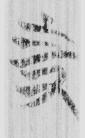寺
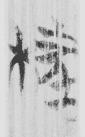{木㞷}
